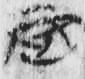○（返）
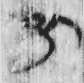孑
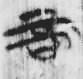言
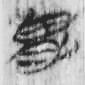{胃刀}（謂）
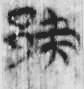邞
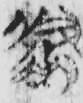○（拳）
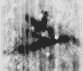之
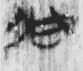○（孥）
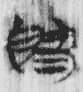既
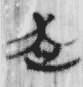走
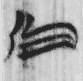於
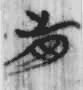前
